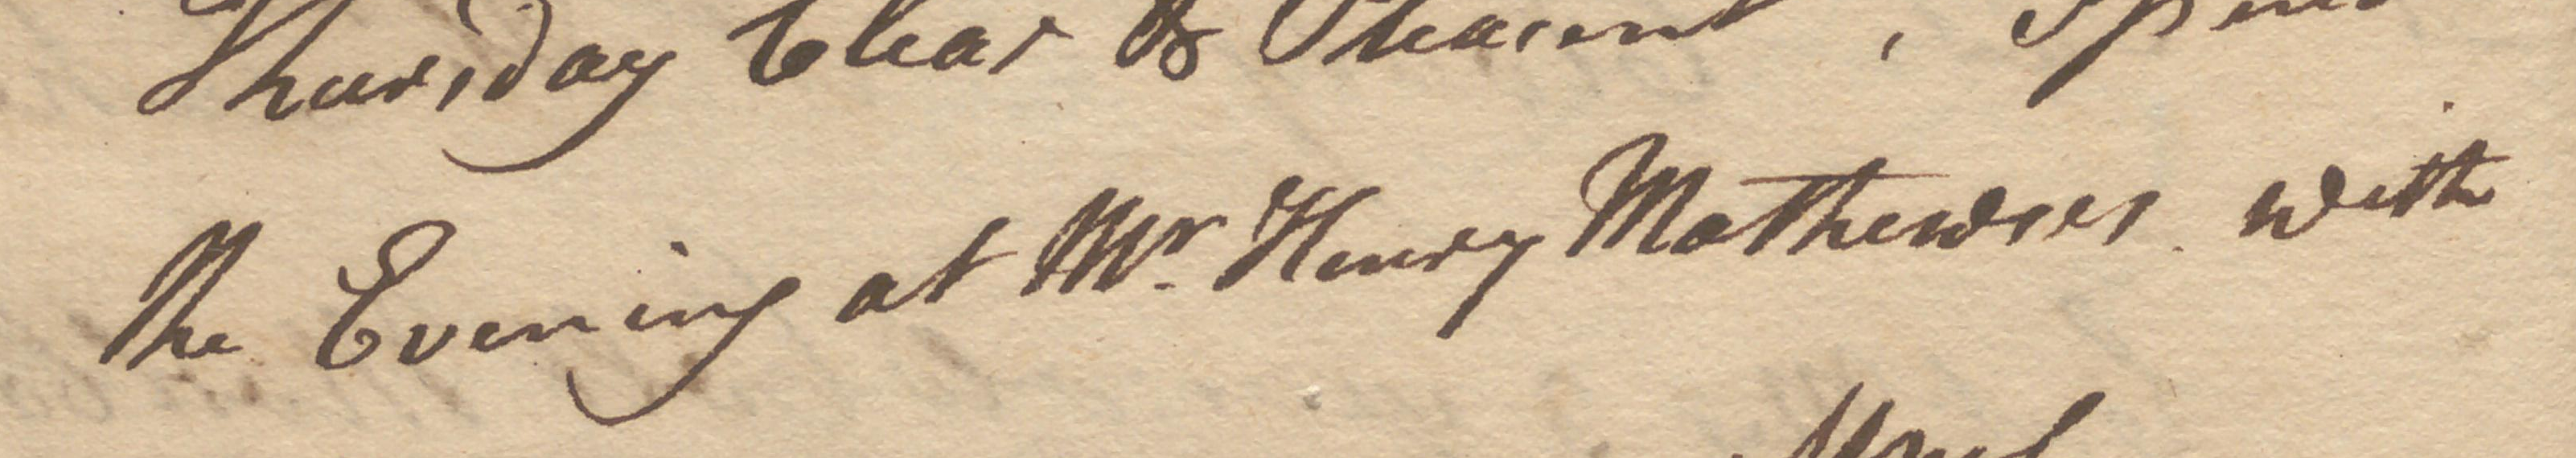the Evening at M^r. Henry Mathewses with
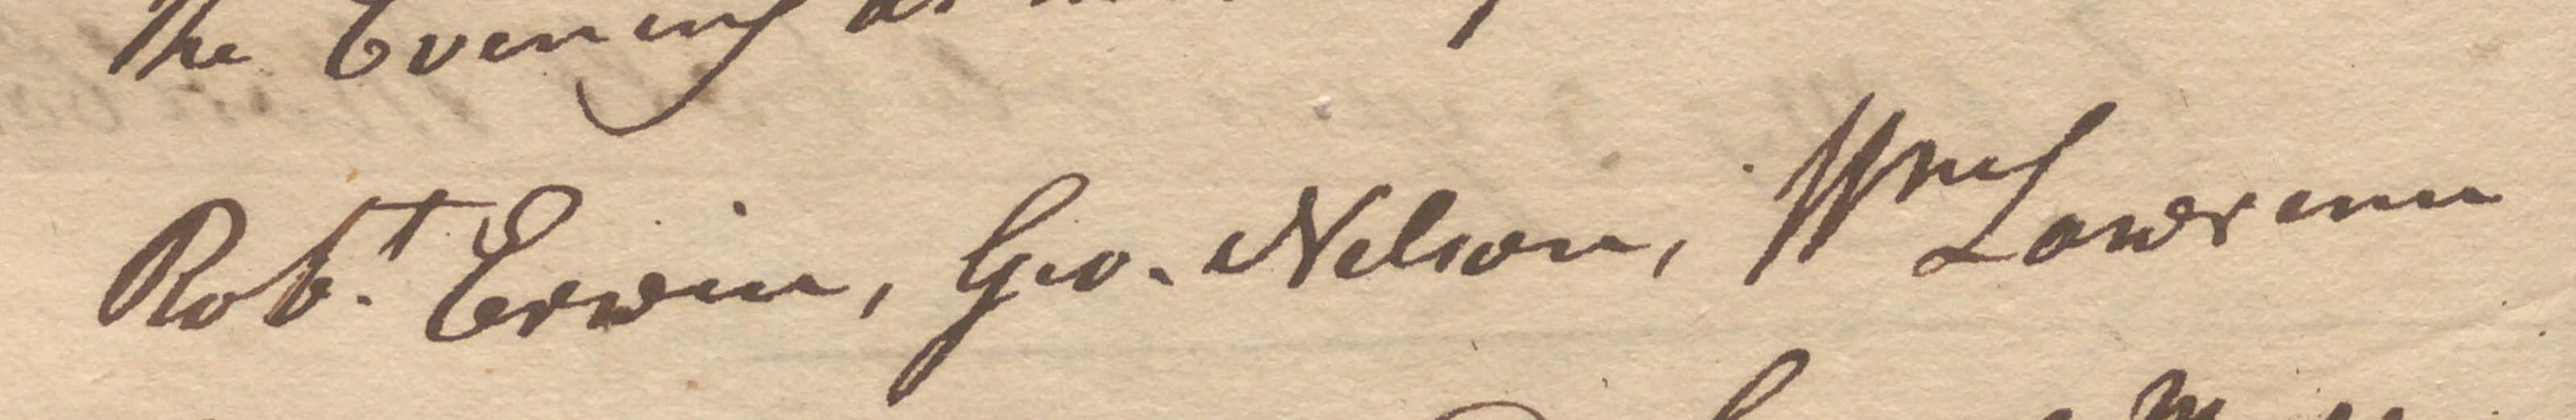Rob^t. Erwin, Geo. Nelson, W^m Lawrence
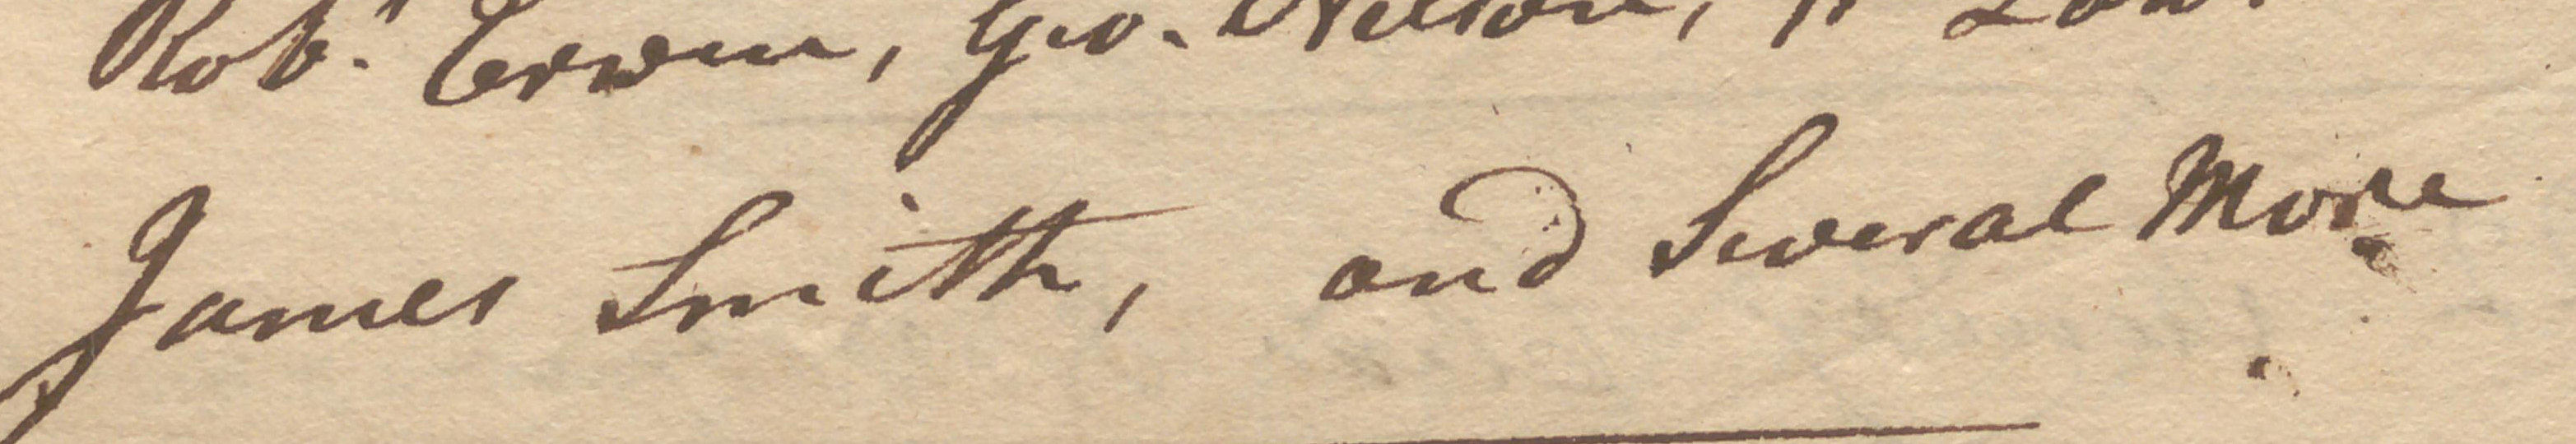James Smith, and Several More
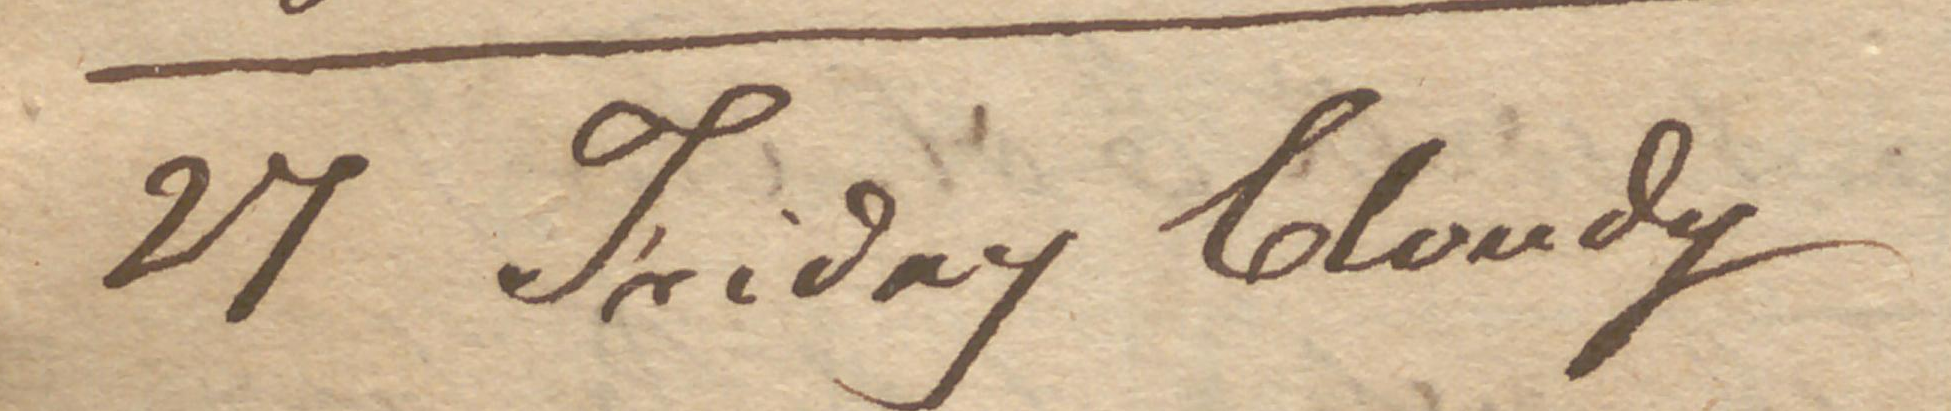27 Friday Cloudy
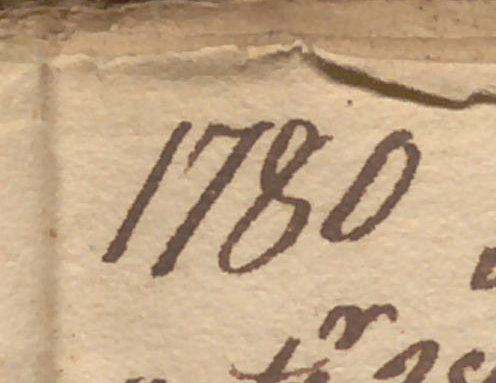1780
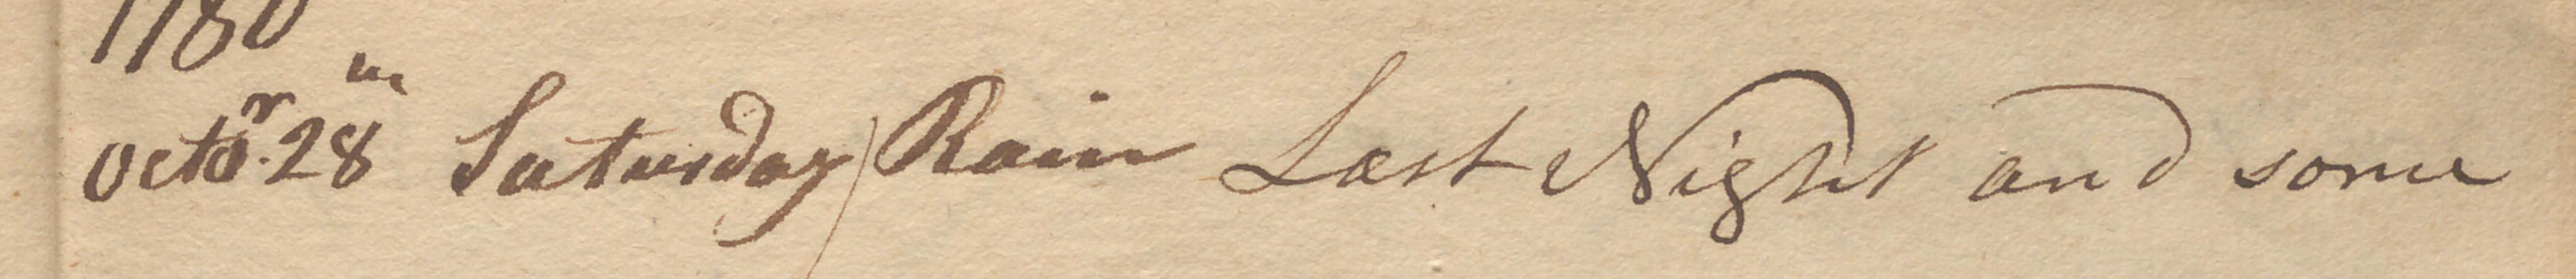Octo^r. 28^th Saturday Rain Last Night and some
